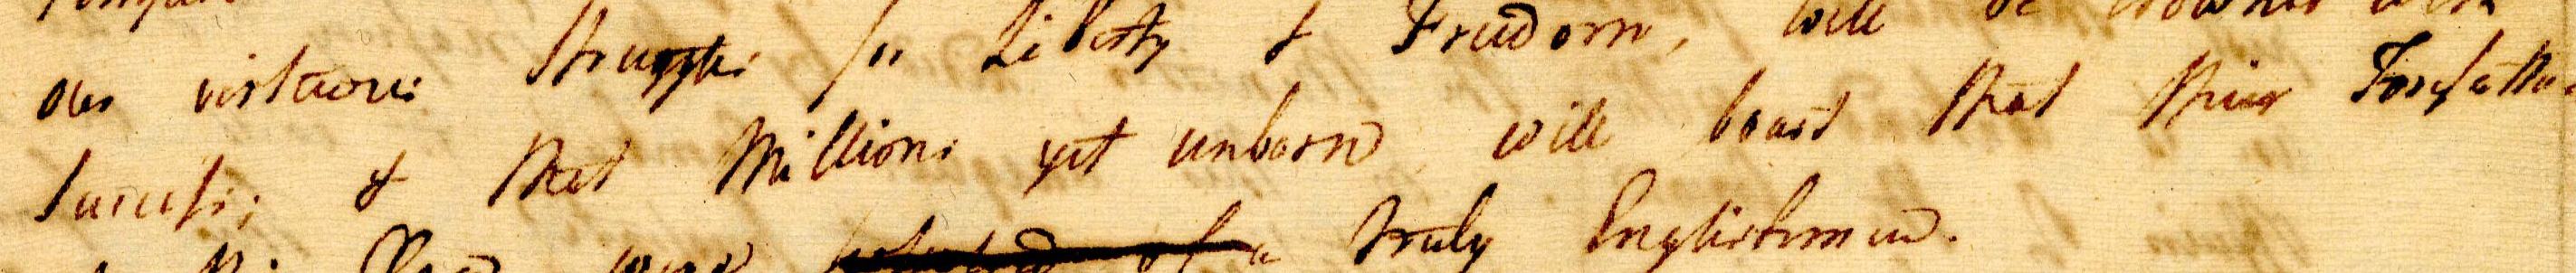Success & that Millions yet unborn will boast that their Forefathers
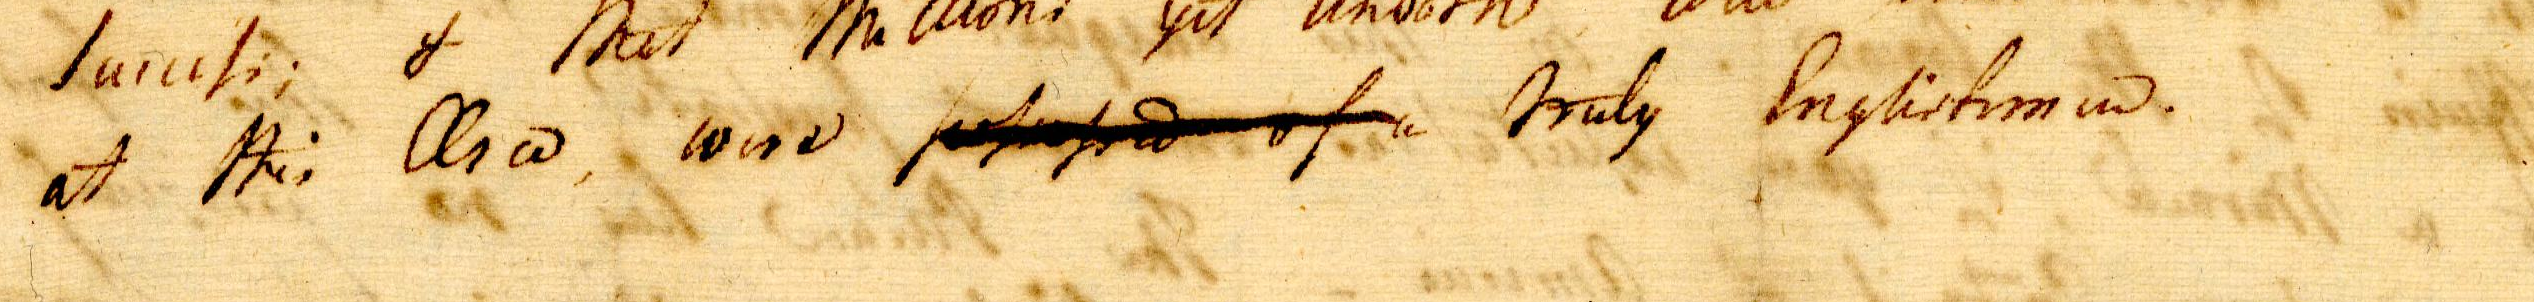at this Alsce were [possessed of a] truly Englishmen.
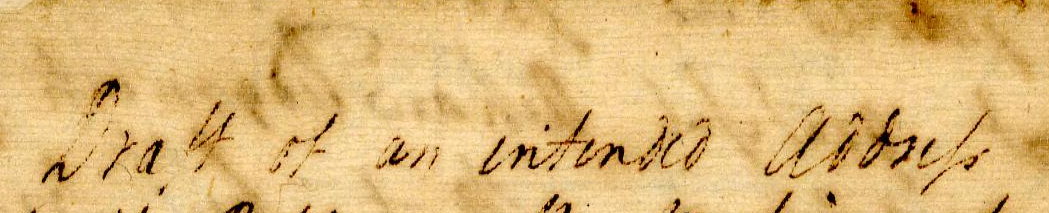Draft of an intended Address
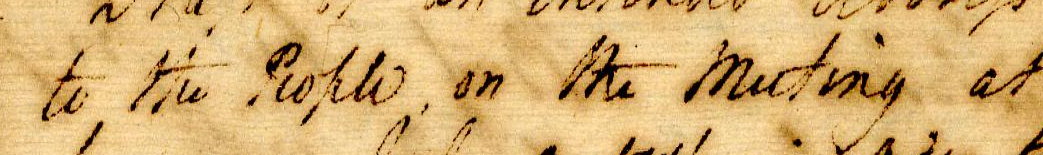to the People, on the Meeting at
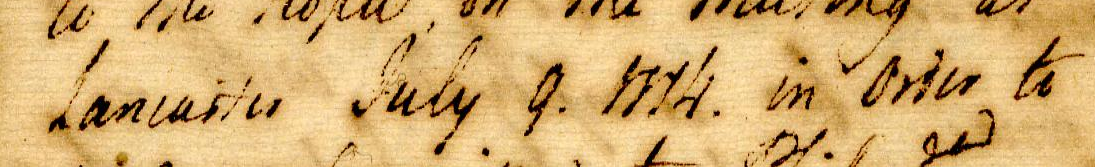Lancaster July 9. 1774. in Order to
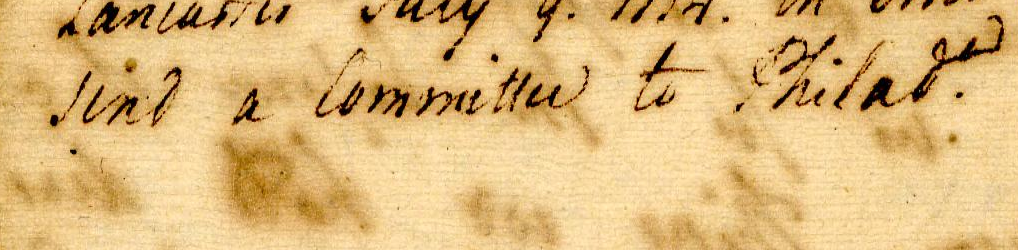send a Committee to Philad^a.
